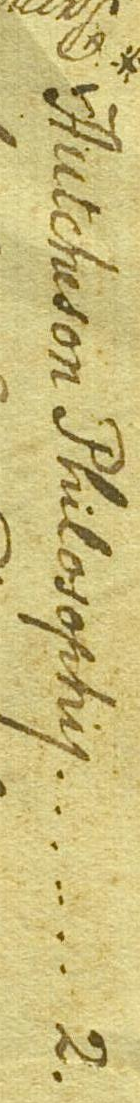- Hutcheson Philosophy......2.
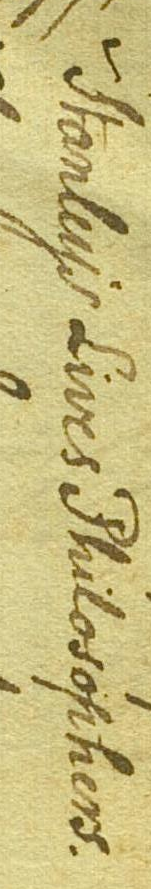- Stanley's Lives Philosophers.
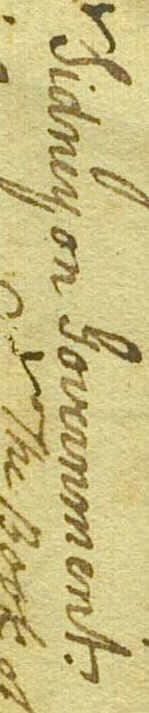- Sidney on Government.
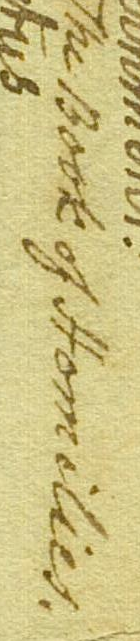- The Book of Homilies.
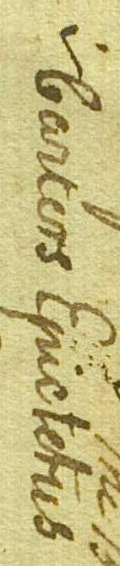- Carters Epictetus
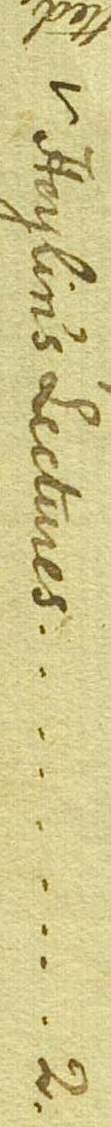- Heylin's Lectures.........2.
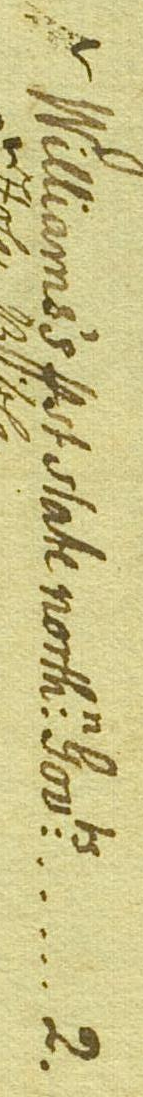- Williams's pst state north^n: Gov^ts. ..... 2.
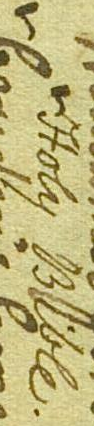- Holy Bible.
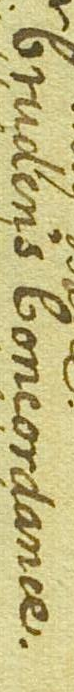- Cruden's Concordance.
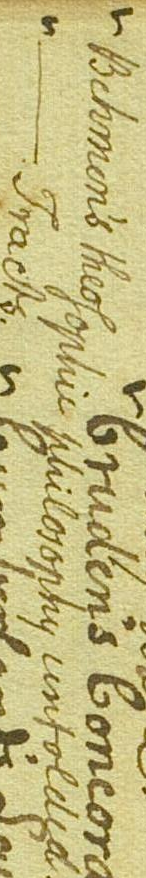- Behman's theosophie philosophy unfolded.
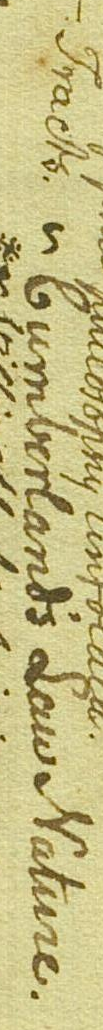Tracts - Cumberland's Law Nature.
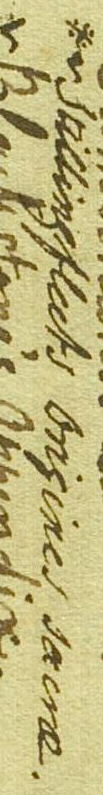- Stillingfleets origines sacræ.
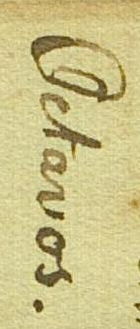Octavos.
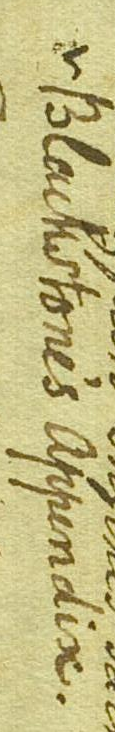- Blackstone's Appendix.
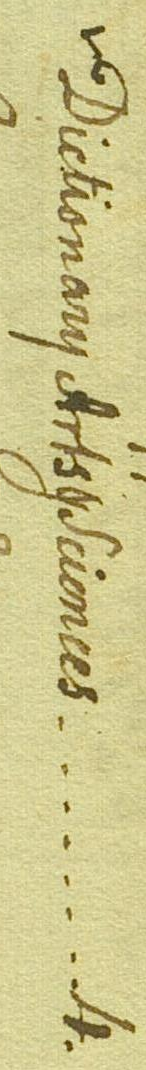- Dictionary Arts & Sciences ....... 4.
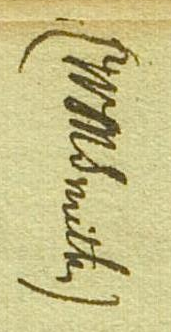(WM Smith)
